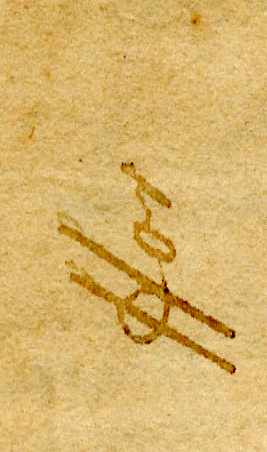ffor
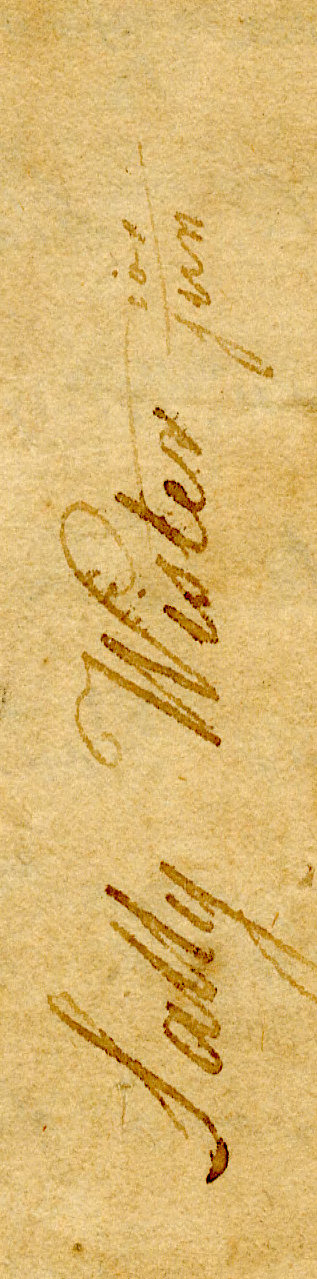Sally Wister jun
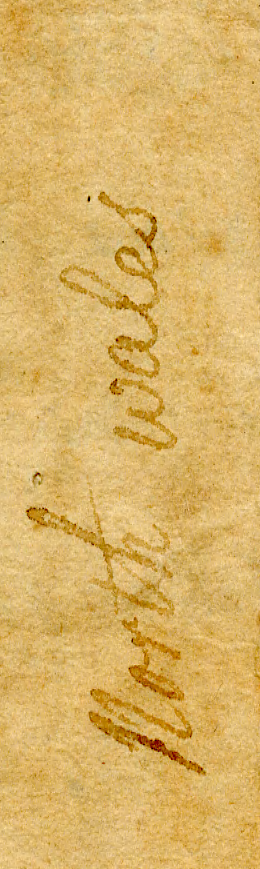North Wales
